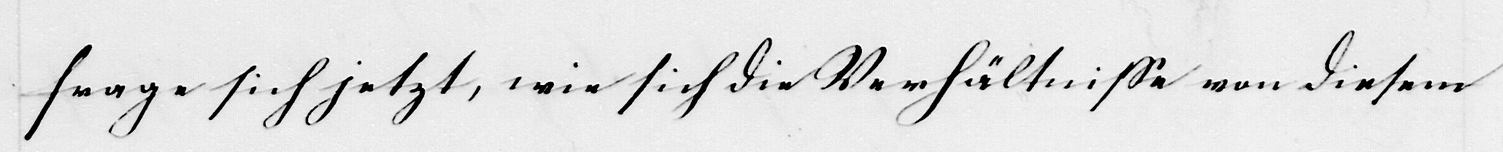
frage sich jetzt, wie sich die Verhältniße von diesem
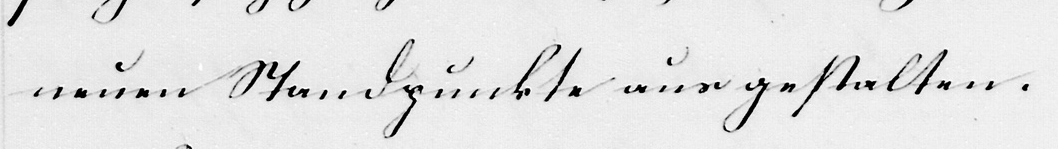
neuen Standpunkte aus gestalten.
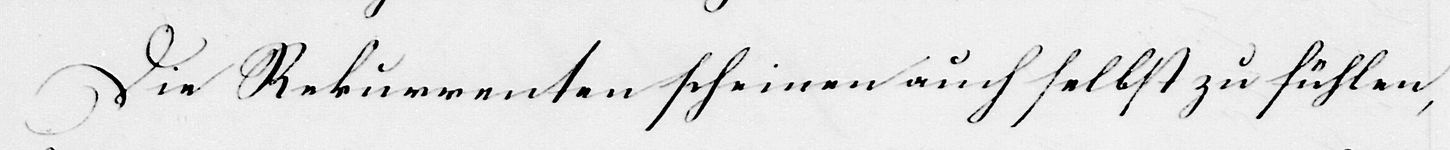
Die Rekurrenten scheinen auch selbst zu fühlen,
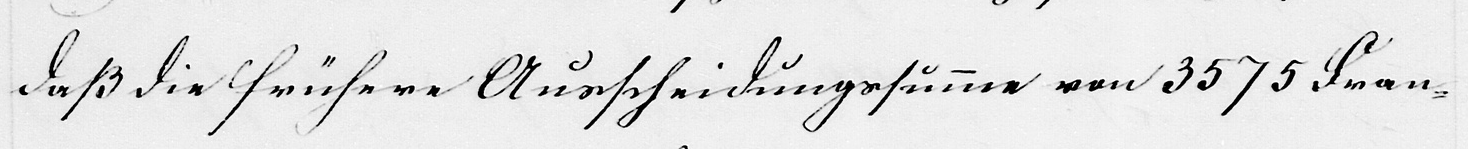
daß die frühere Ausscheidungssumme von 3575 Fran¬
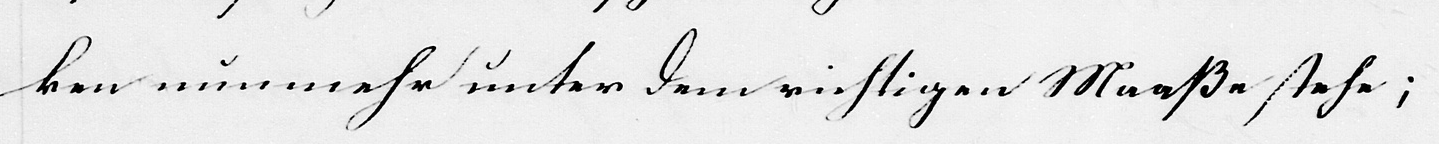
ken nunmehr unter dem richtigen Maaße stehe;
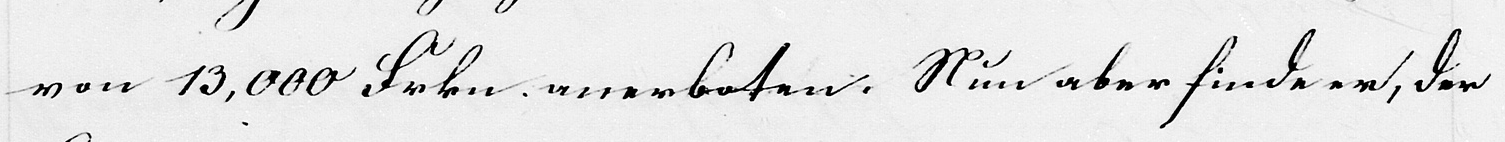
von 13,000 Frkn. anerboten. Nun aber finde er, der
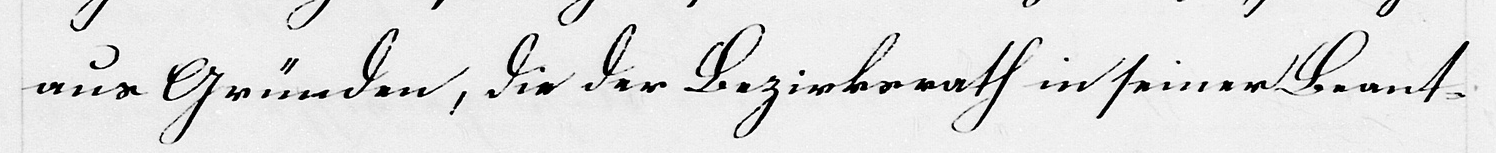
aus Gründen, die der Bezirksrath in seiner Beant¬
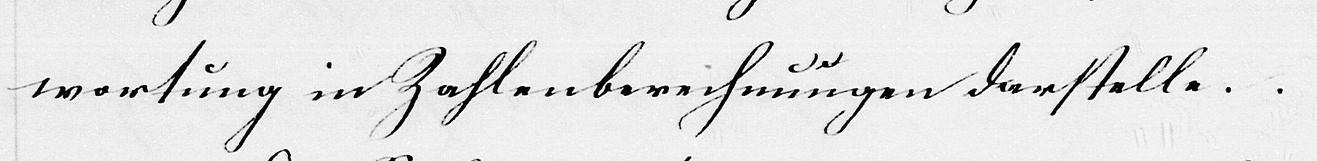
wortung in Zahlenberechnungen darstelle.
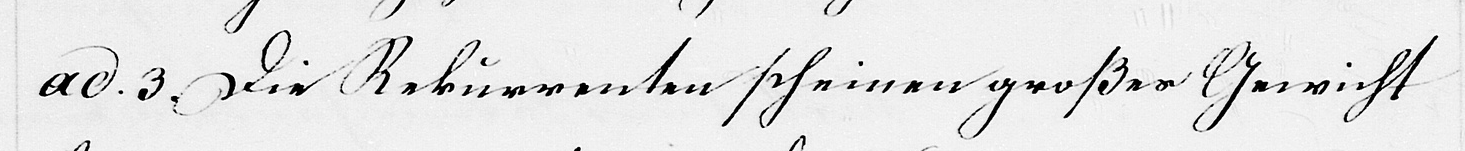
ad. 3. Die Rekurrenten scheinen großes Gewicht
